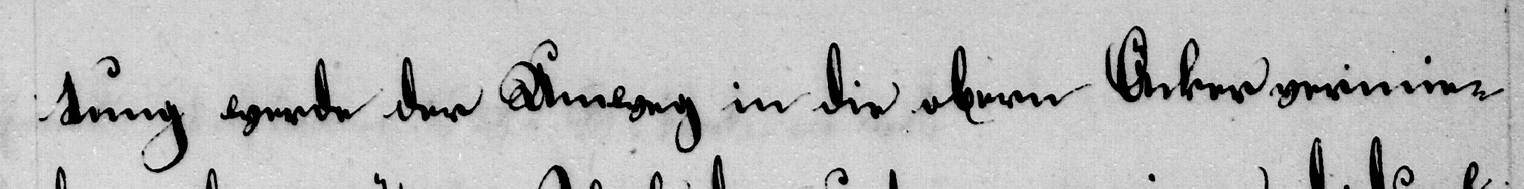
tung werde der Umweg in die obern Äcker vermie¬
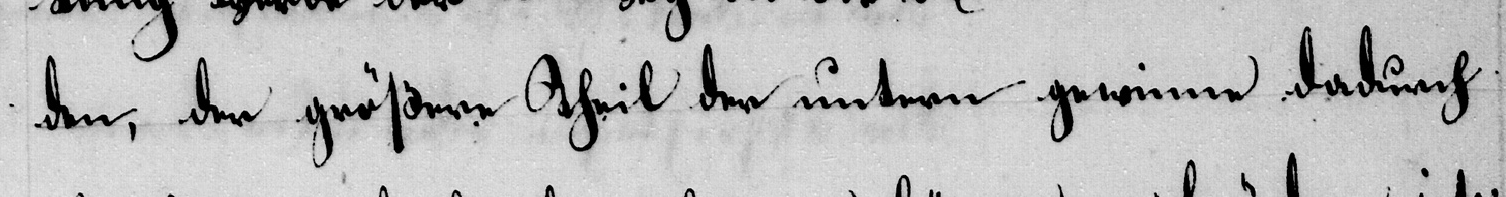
den, der größere Theil der untern gewinne dadurch
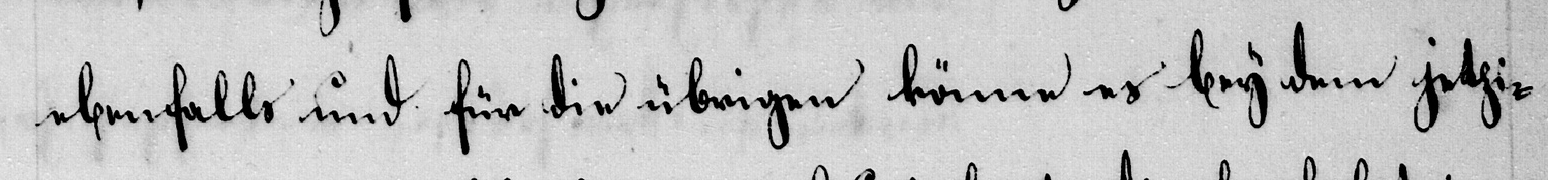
ebenfalls und für die übrigen könne es bey dem jetzi¬
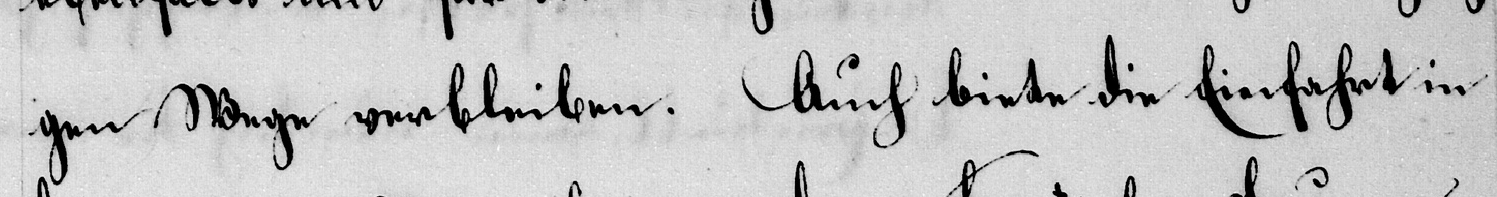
gen Wege verbleiben. Auch biete die Einfahrt in
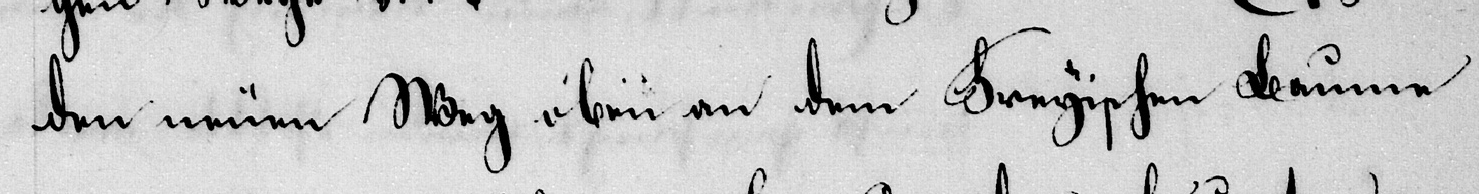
den neuen Weg oben an dem Freyischen Baume
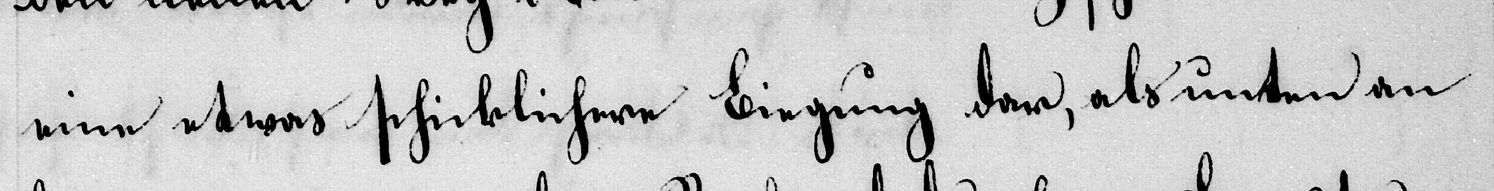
eine etwas schicklichere Biegung dar, als unten an
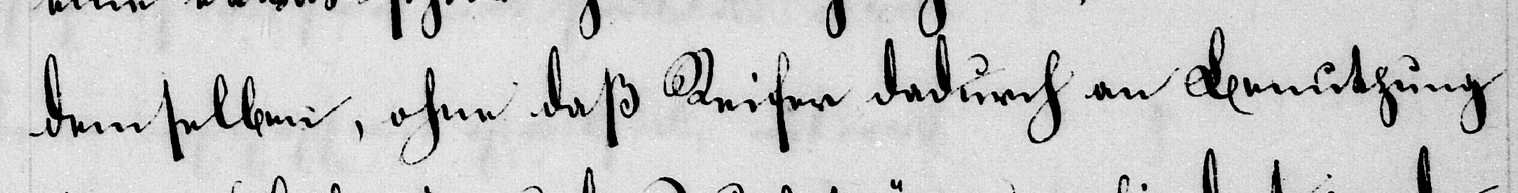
demselben, ohne daß Reifer dadurch an Benutzung
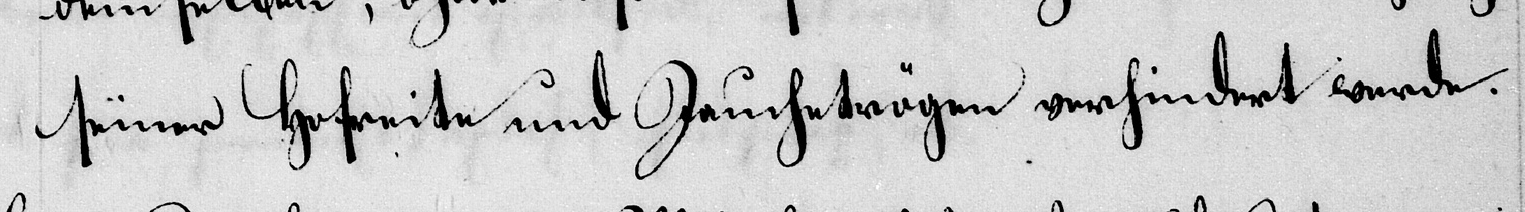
seiner Hofreite und Jauchetrögen verhindert werde.
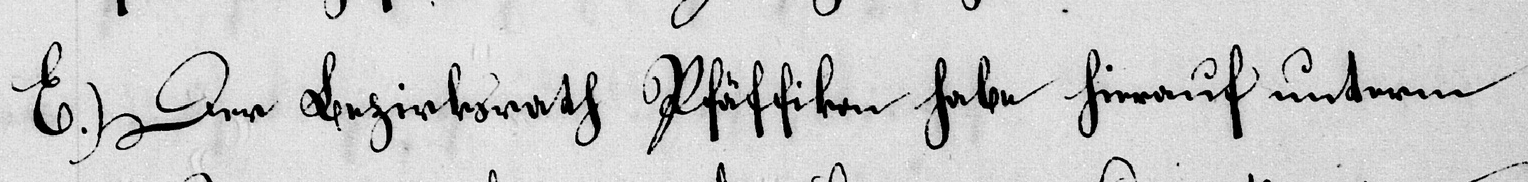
E.) Der Bezirksrath Pfäffikon habe hierauf unterm
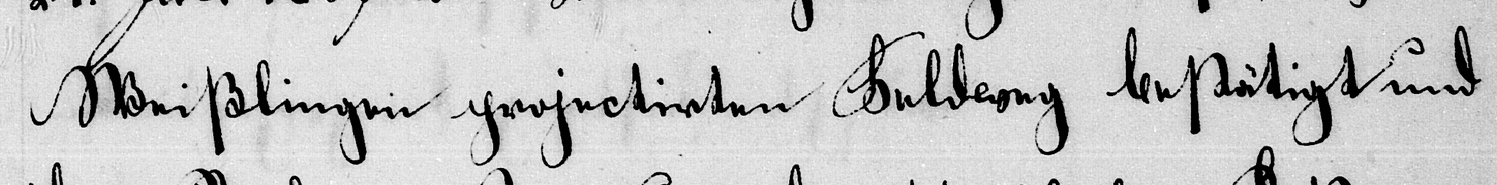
Weißlingen projectirten Feldweg bestätigt und
